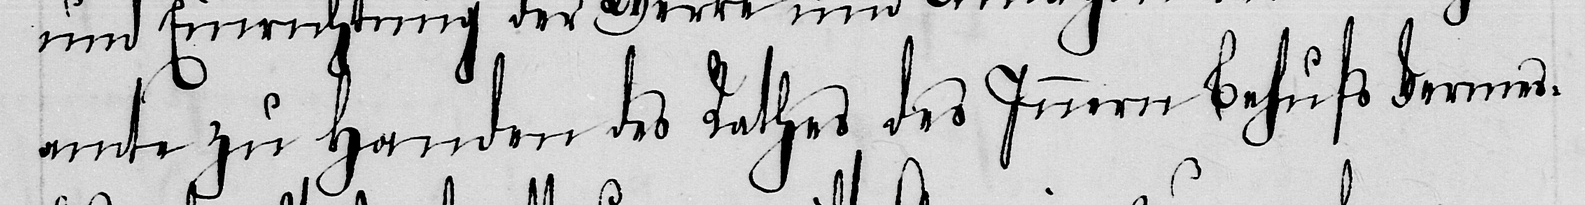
amte zu Handen des Rathes des Innern Behufs Vermeß¬
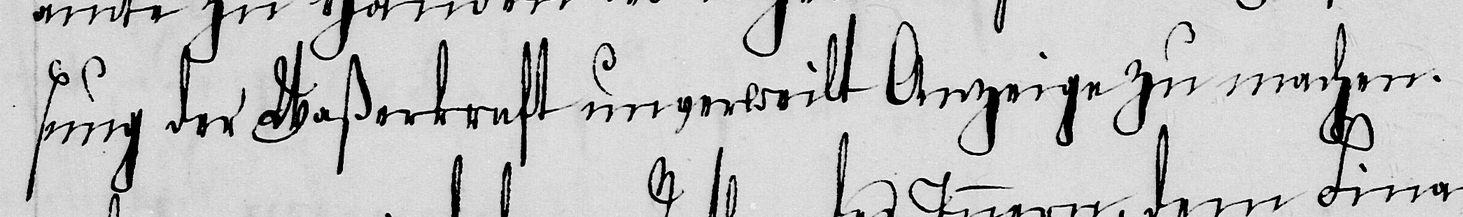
ung der Waßerkraft unverweilt Anzeige zu machen.
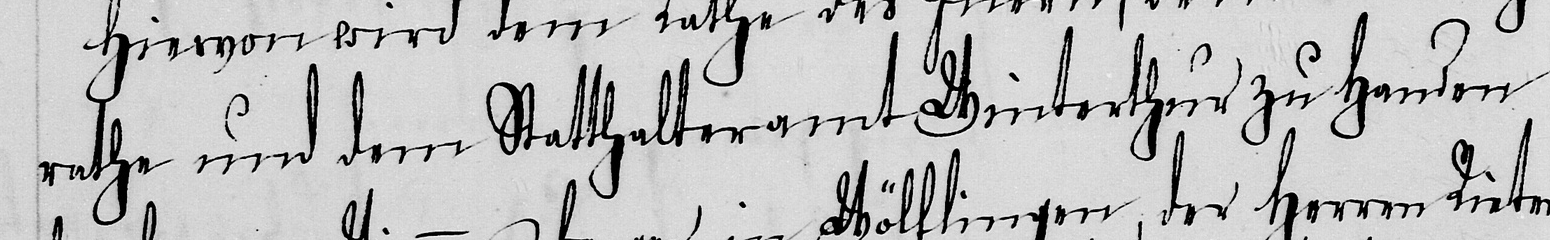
rathe und dem Statthalteramt Winterthur zu Handen
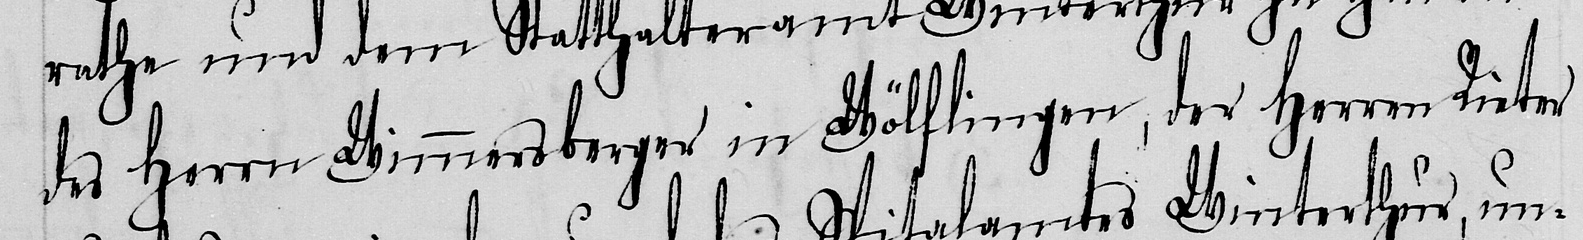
des Herrn Wimmersberger in Wölflingen, der Herren Rieter
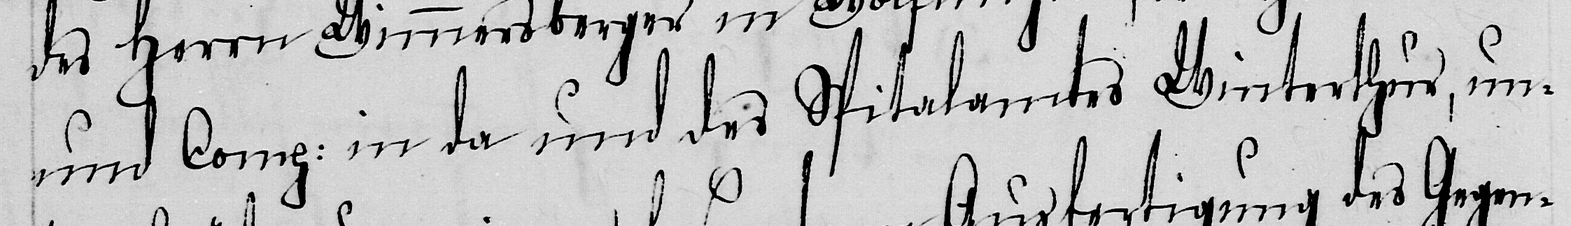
und Comp: in da und des Spitalamtes Winterthur, un¬
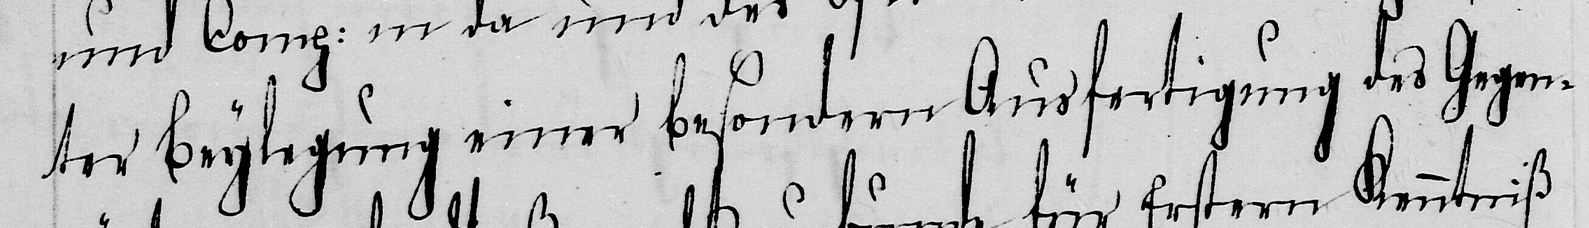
ter Beylegung einer besondern Ausfertigung des Gegen¬
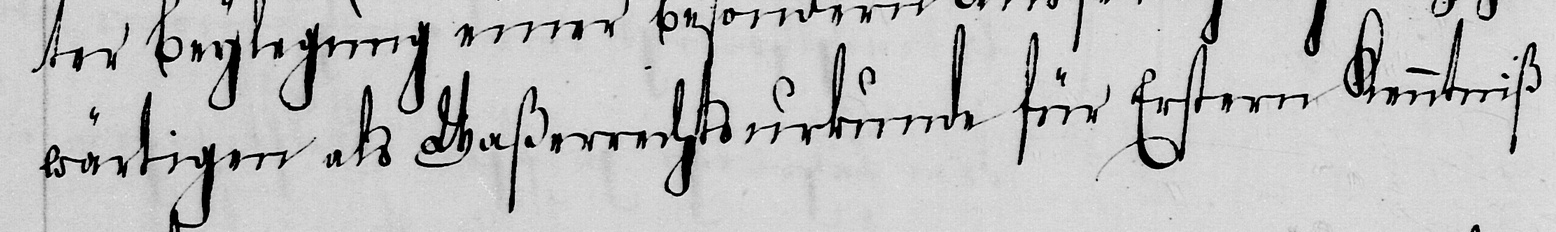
wärtigen als Waßerrechtsurkunde für Erstern Kenntniß
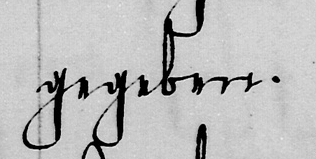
gegeben.
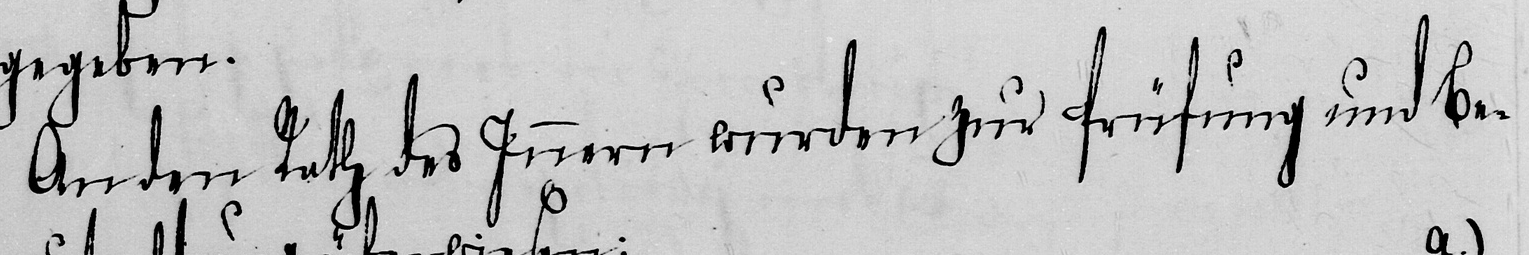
An den Rath des Innern wurden zur Prüfung und Be¬
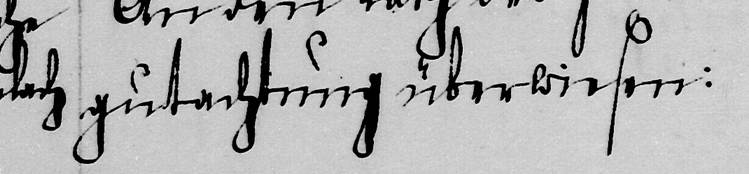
gutachtung überwiesen:
